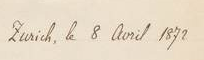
Zurich, le 8 Avril 1872
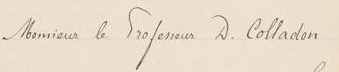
Monsieur le Professeur D. Colladon
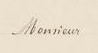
Monsieur
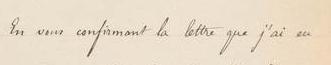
En vous confirmant la lettre que j'ai eu
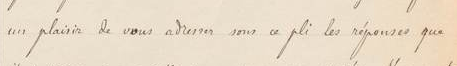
un plaisir de vous adresser sous ce pli les réponses que
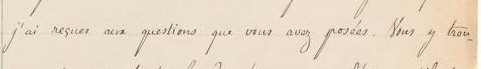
j'ai reçues aux questions que vous avez posées. Vous y trou-
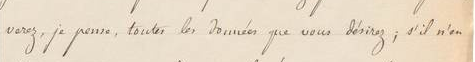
verez, je pense, toutes les données que vous désirez; s'il n'en
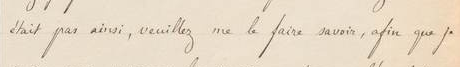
était pas ainsi, veuillez me le faire savoir, afin que je
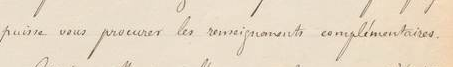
puisse vous procurer les renseignements complémentaires.
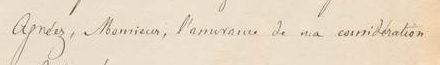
Agréez, Monsieur, l'assurance de ma considération
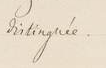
distinguée.
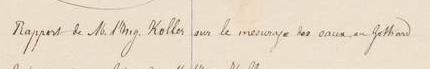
Rapport de M. l'Ing. Koller sur le mesurage des eaux au Gothard
